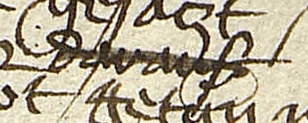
darauf
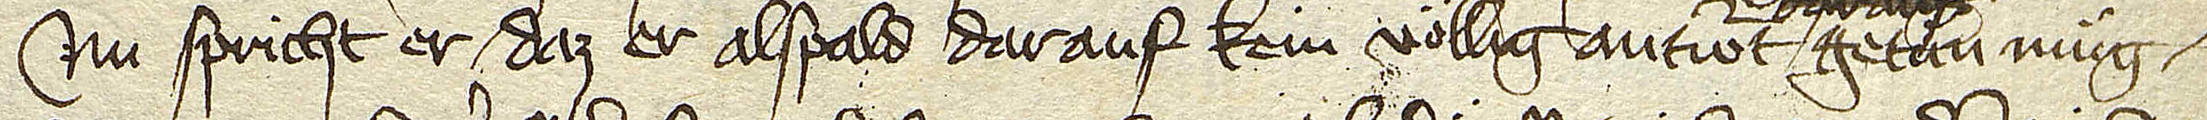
Nu ſpricht er / daʒ er alſpald darauf kein völlig antw*t getün müg /
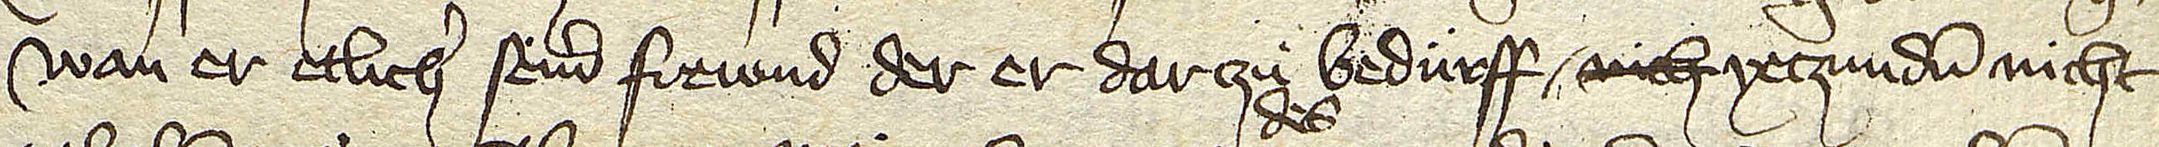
wan er etlich* ſein* frewnd der er darcʒu bedürff / nich yecʒundn* nicht
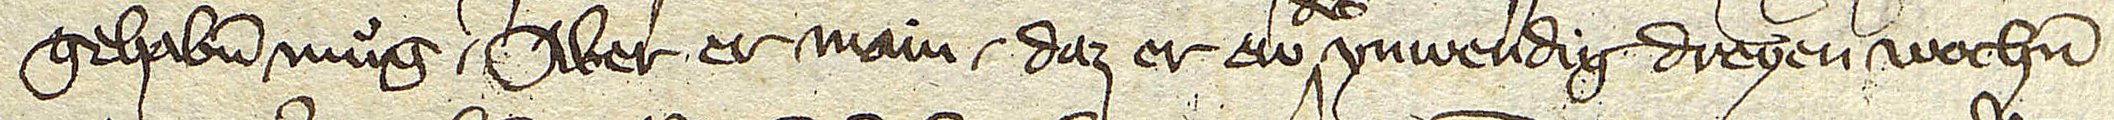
gehabn* müg / Aber er main / daʒ er ew ynwendig dreyen wochn*
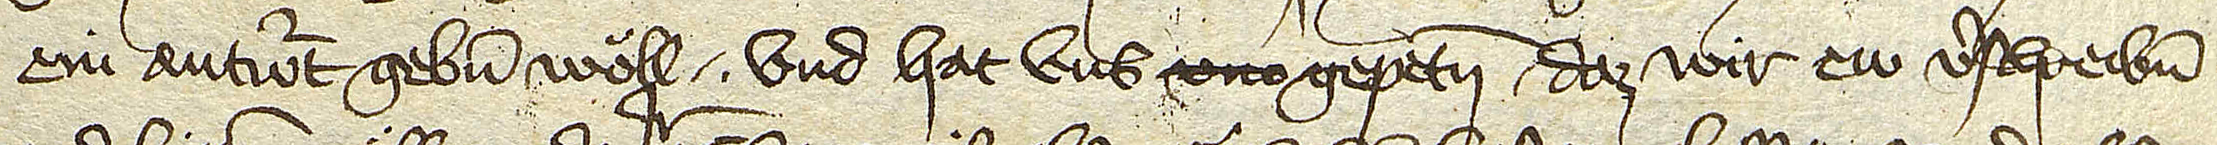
ein antw*t gebn* wöll / . vnd hat vns vns gepetn* / daʒ wir ew v*ſchreibn*
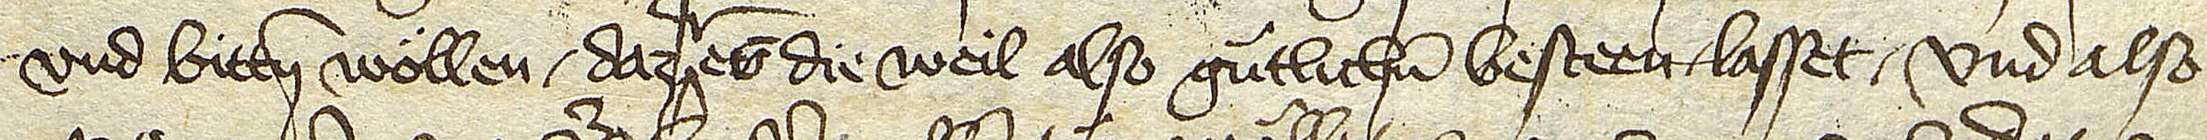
vnd bittn* wöllen / daʒ es die weil alſo gütlichn* beſteen / laſſet / vnd alſo
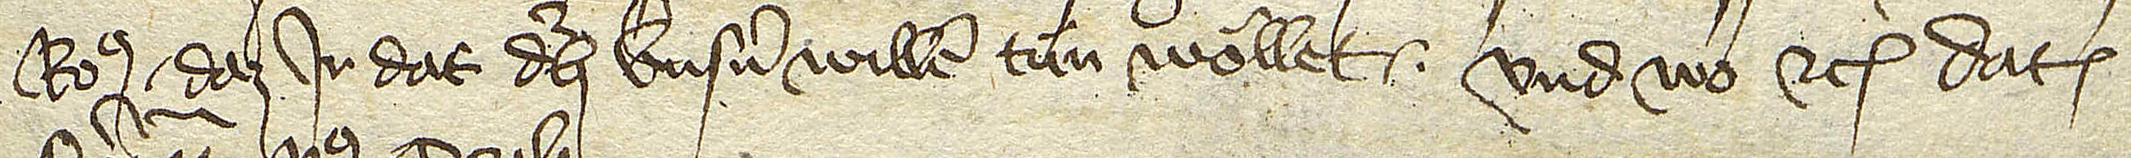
Ro* / daʒ Ir das d*h vnſn* wille* tün wöllet / . vnd wo ec* dat*
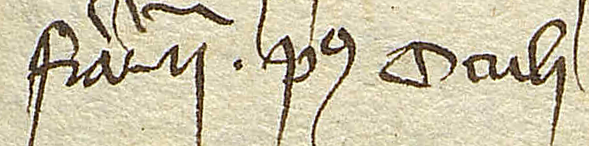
fia* ii* . p* Oculi
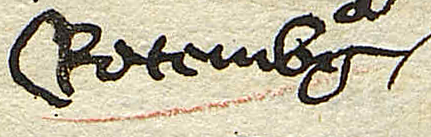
Rotemb*g /
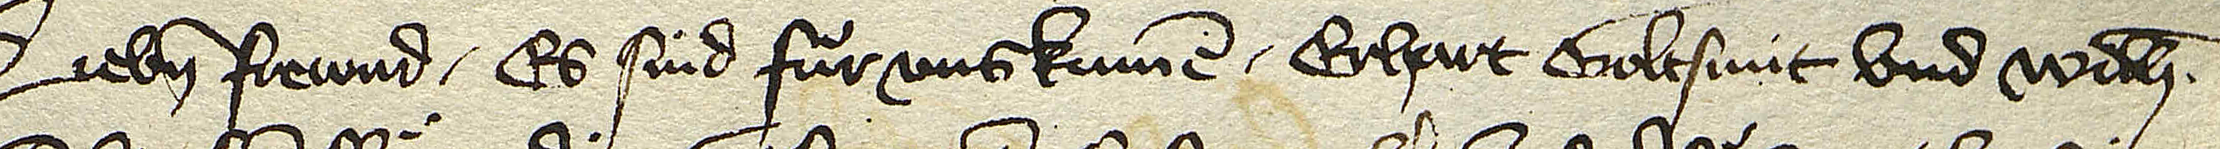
Liebn* frewnd / Es ſind für vns kume* / Erhart Goltſmit vnd wilh*
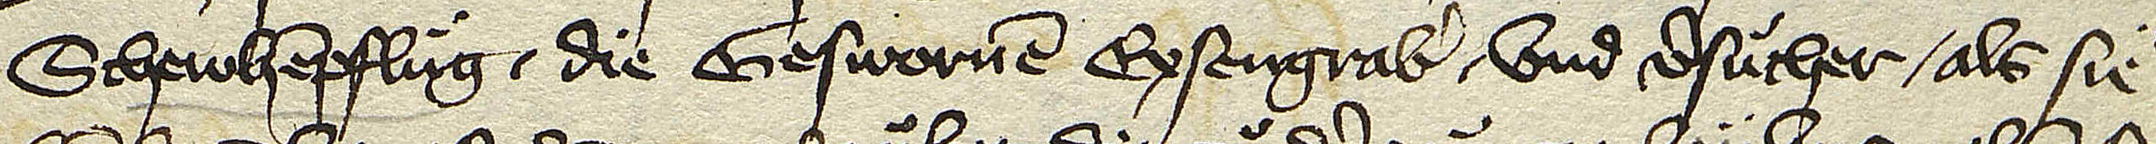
Schewhe*pflüg / die Geſworne* Eyſengrab* / vnd v*ſücher / als ſie
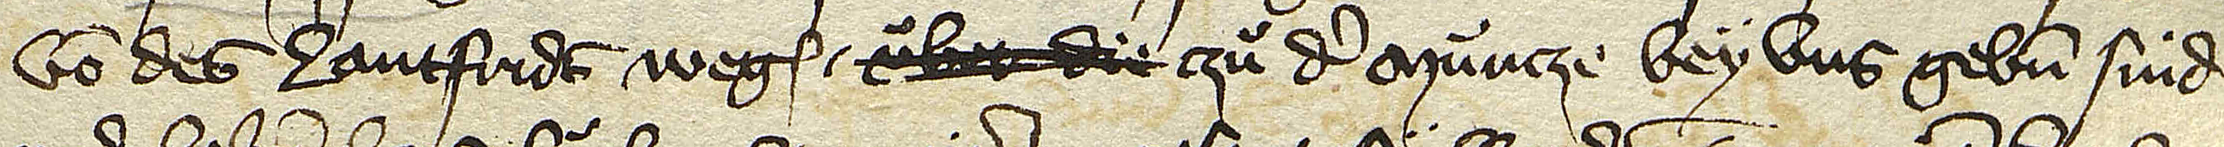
vo* des Lantfrids weg* / v̈ber die cʒü d* Müncʒe bey vns gebn* ſind
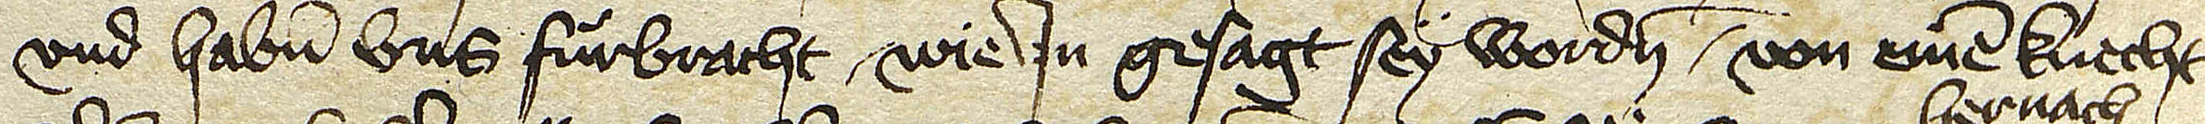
vnd habn* vns fürbracht / wie In geſagt ſey wordn* / von eine* knecht
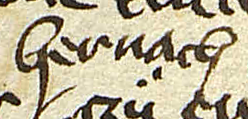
hernach
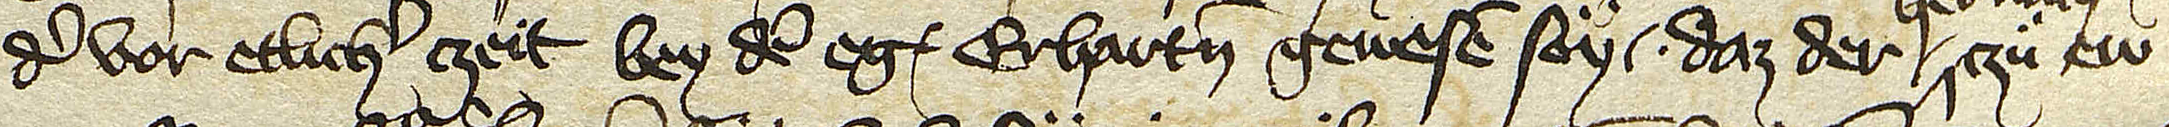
d* vor etlich* cʒeit bey d* eg* Erhartn* geweſe* ſey / . daʒ der cʒü ew
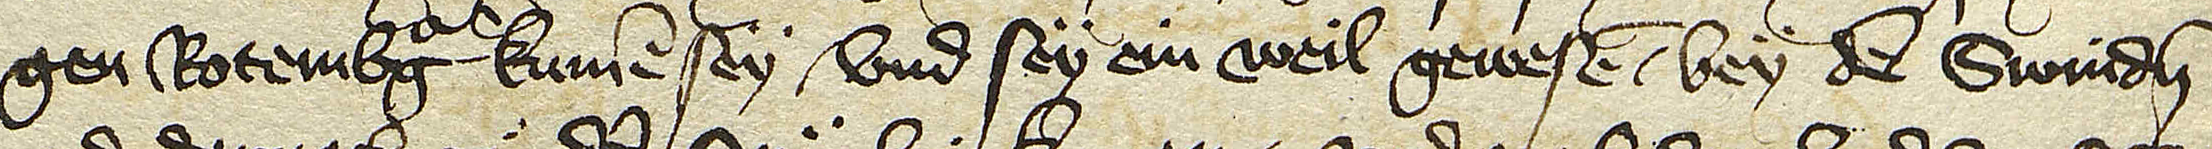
gen Rotemb*g kume* ſey / vnd ſey ein weil geweſe* / bey d* Swindn*
